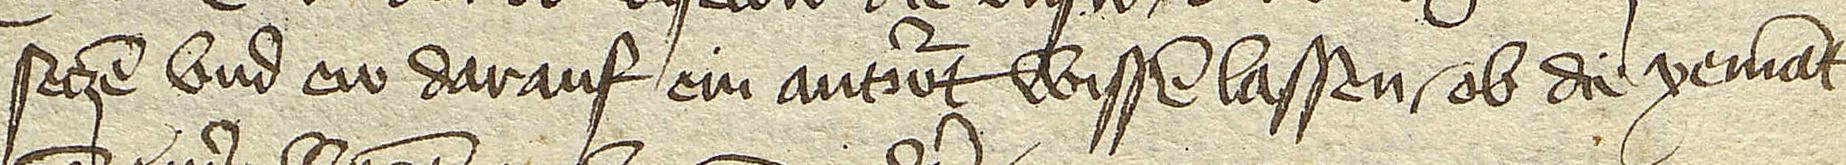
ſecʒe* vnd ew darauf ein antwt* wiſſe* laſſen / ob die yemat*
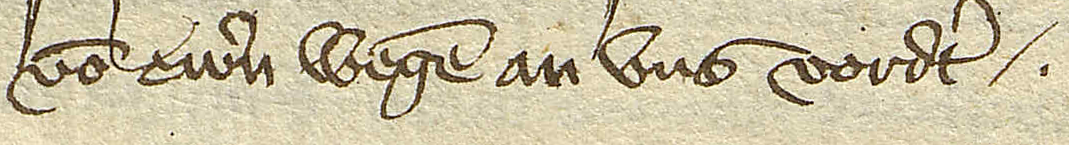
vo* ew*n wege* an vns vordt* / .
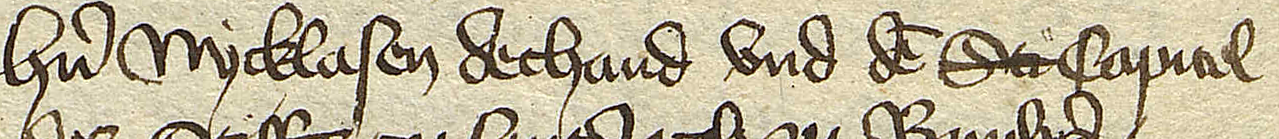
hn* Nycklaſen dechand vnd de* Sti Capitel
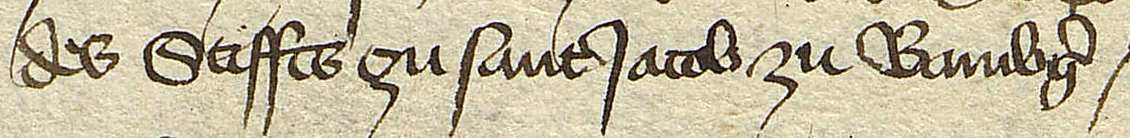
des Stiffts cʒu ſant Iacob cʒu Bambg* /
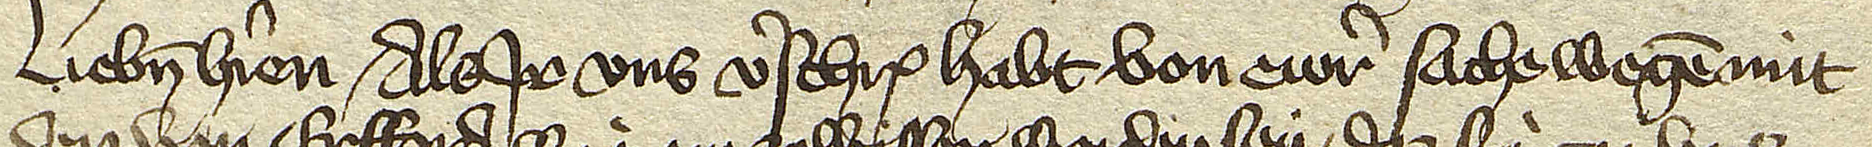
Liebn* h*ren / Als Ir vns v*ſchr* habr von ewr* ſache wege* mit
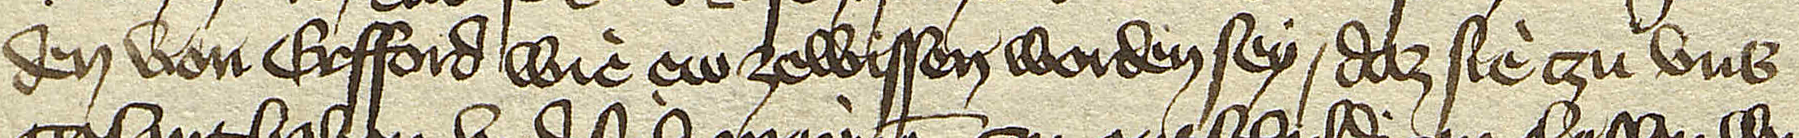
den von Erfford wie ew cʒewiſſen worden ſey / daʒ ſie cʒu vns
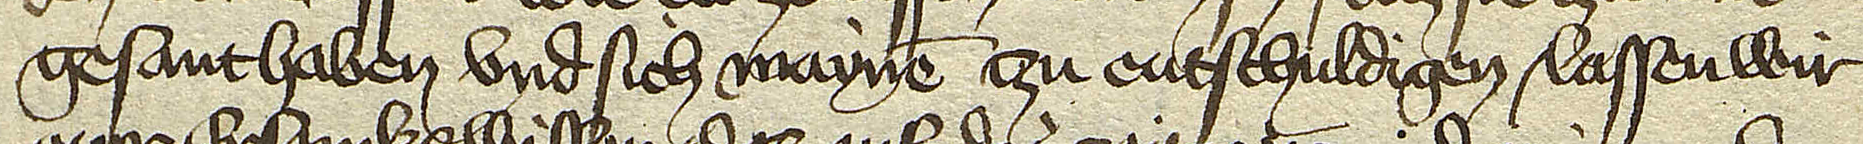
geſant haben vnd ſich mayne* cʒu entſchuldigen / laſſen wir
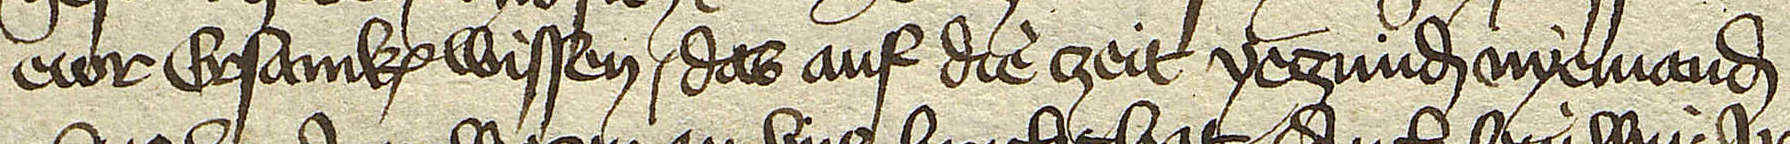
ewr Erſamk* wiſſen / das auf die cʒeit yecʒund* nyemand*
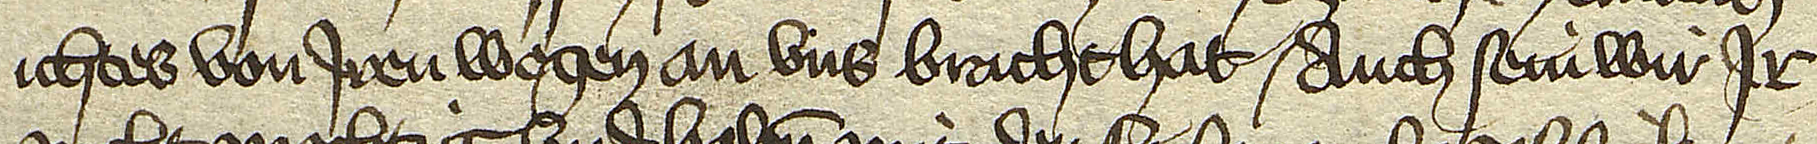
ichtes von iren wegen an vns bracht hat / Auch ſein wir Ir
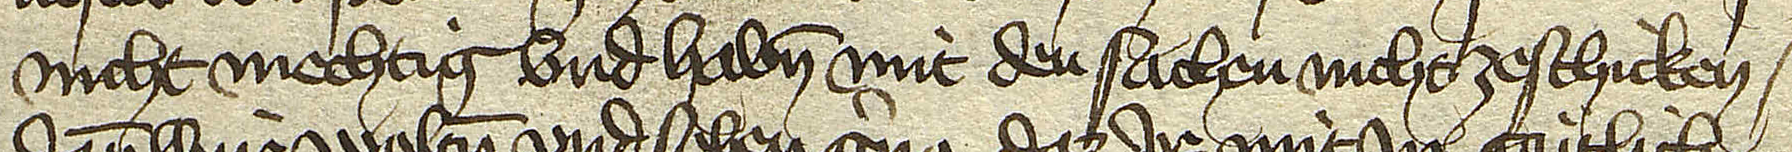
nicht mechtig vnd habn* mit den ſachen nicht cʒeſchicken /
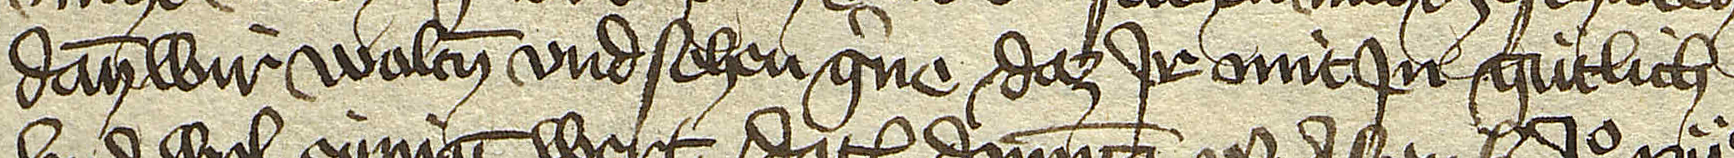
dan* wir woltn* vnd ſehen g*ne / daʒ Ir mit In gütlich
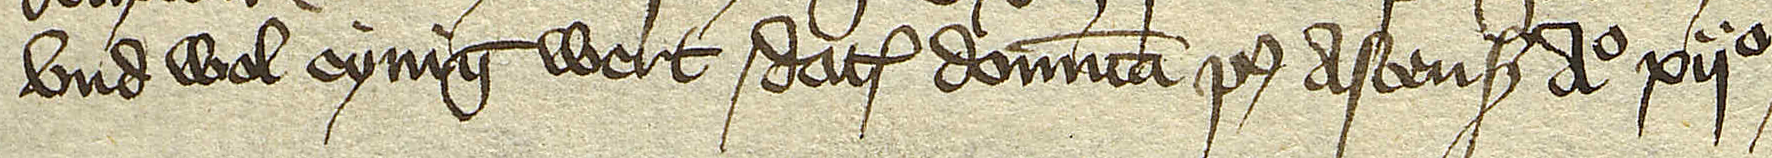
vnd wol eynig wert / dat* domica* p* Aſcenſ* A* xii* /
